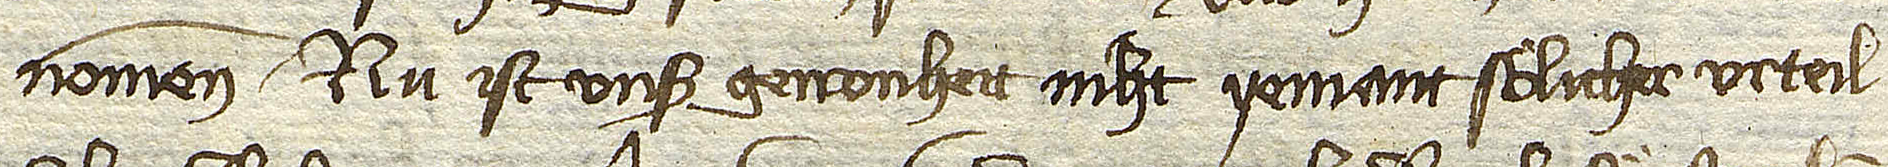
nom*en / Nu iſt vnſ* gewonheit niht yemant ſölicher vrteil
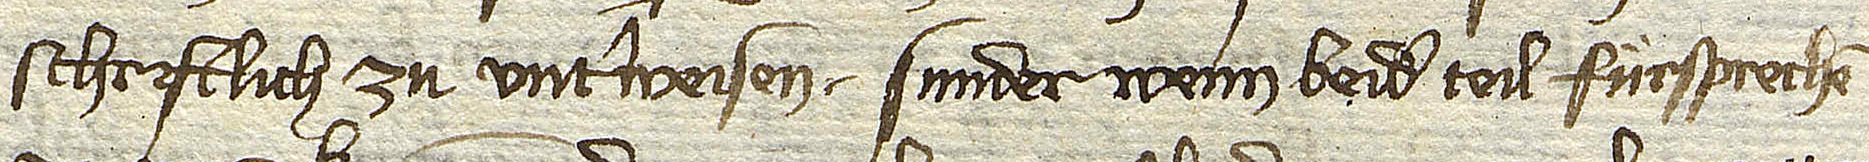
ſchriftlich ʒu vnt*weiſen . ſunder wenn beid* teil fürſpreche*
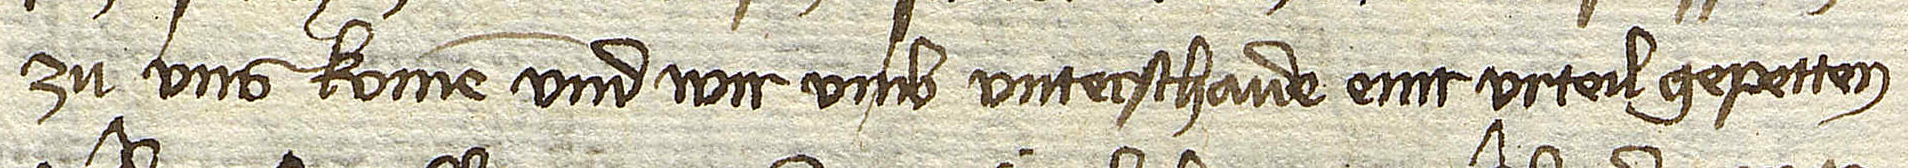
ʒu vns kome* vnd wir vmb vnterſchaide einr vrteil gepetten
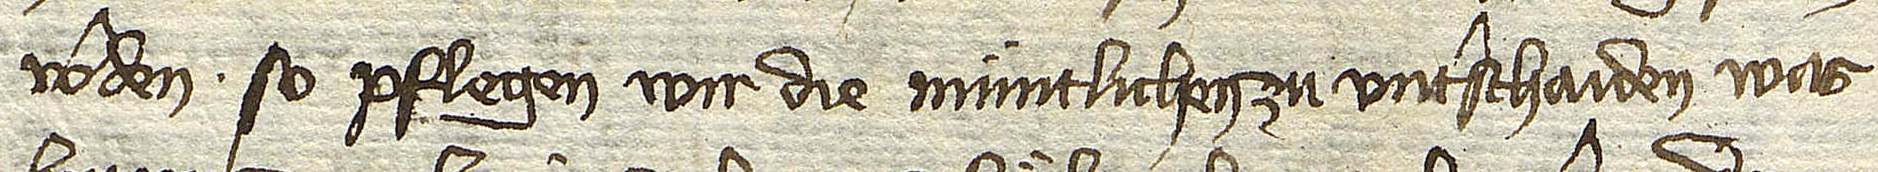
w*den . ſo pflegen wir die müntlichen ʒu vnt*ſchaiden was
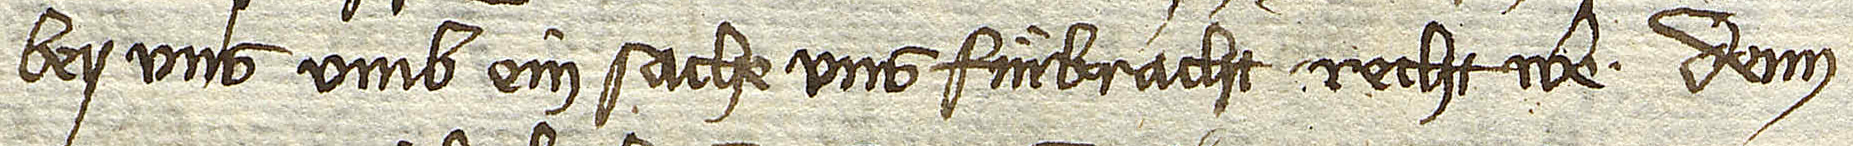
bey vns vmb ein ſache vns fürbracht recht we* . Denn
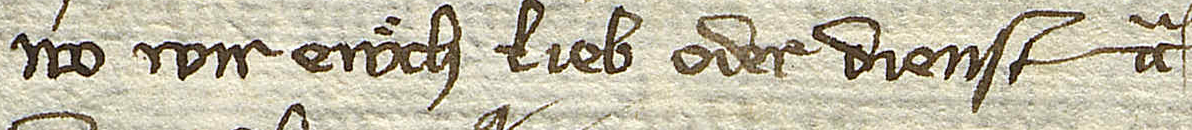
wo wir ewch lieb oder dienſt ec*
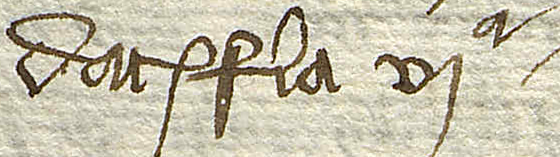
Dat* fia* vi* /
